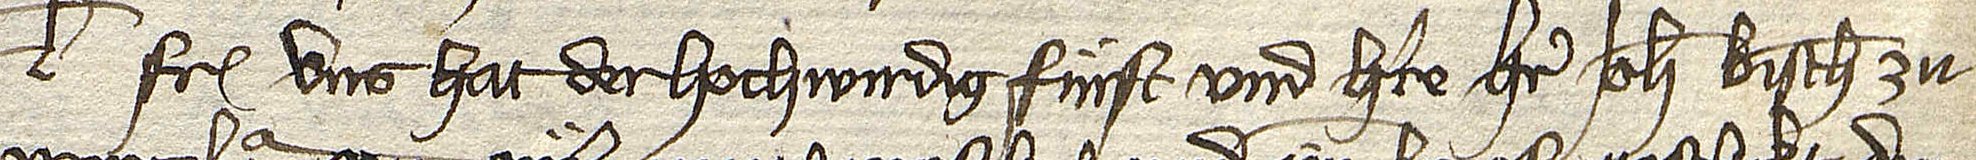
L* fr* vns hat der hochwirdig fürſt vnd h*re Hr* Ioh* biſch* ʒu
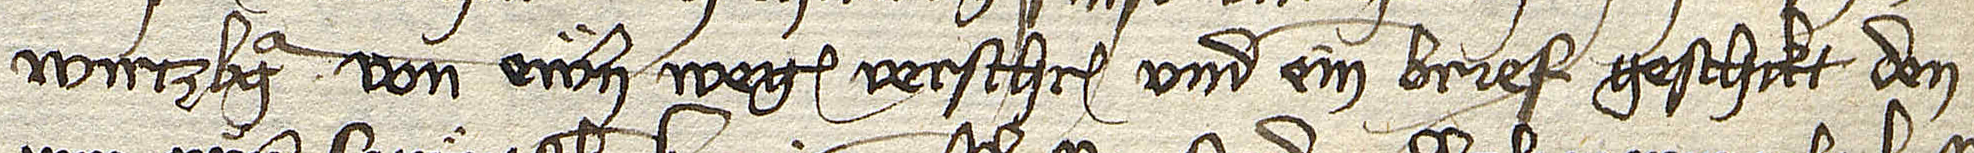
wircʒb*g von eẅ*n weg* verſchr* vnd ein* brief geſchikt den
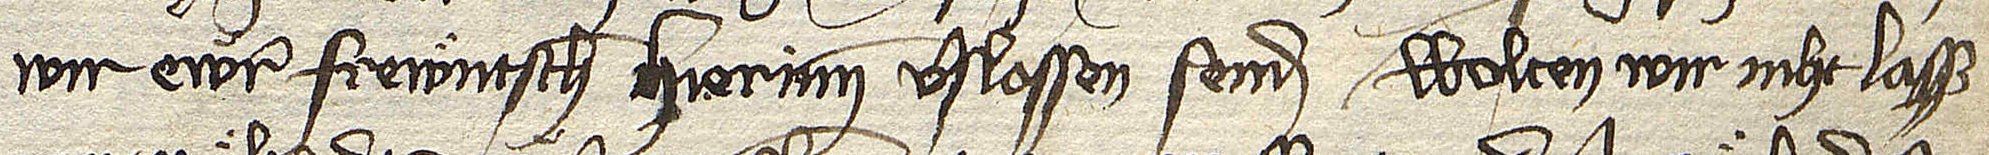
wir eẅr* freẅntſch* hierinn* v*ſloſſen ſend* / Wolten wir niht laſſ*
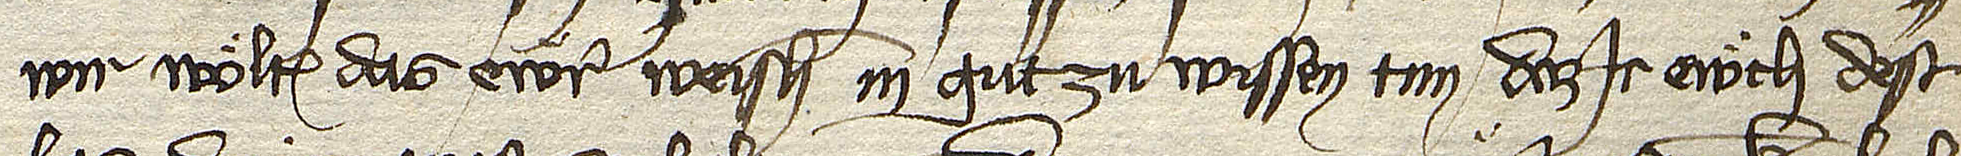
wir wölt* das eẅr* weiſh* in gut ʒu wiſſen tun daʒ Ir eẅch deſt
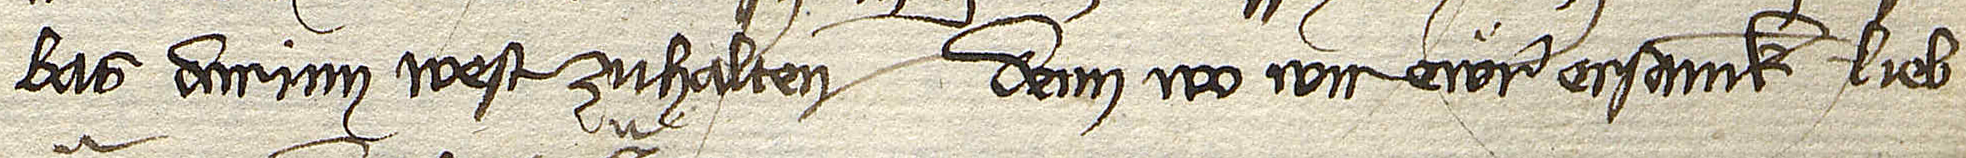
bas darinn weſt ʒuhalten / Denn wo wir eẅr* erſamk* lieb
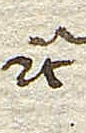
ec*
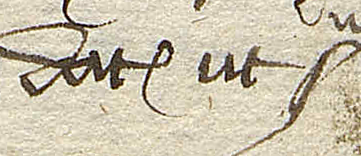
Dat* ut ſ*
